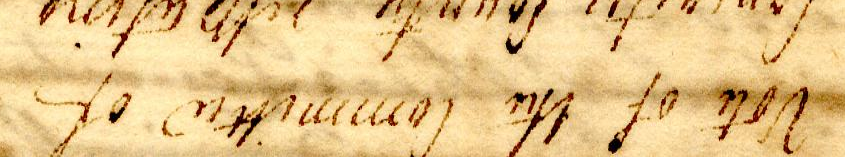Vote of the Committee of
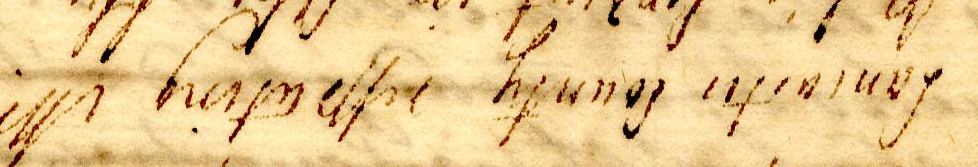Lancaster County respecting M^r
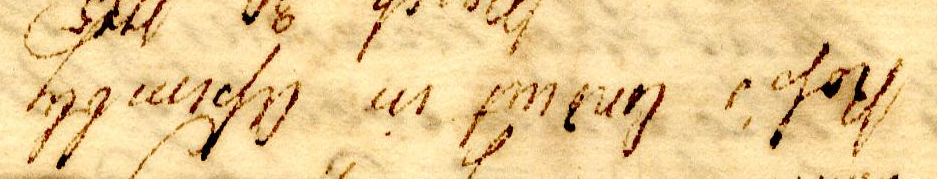Ross's Conduct in Assembly
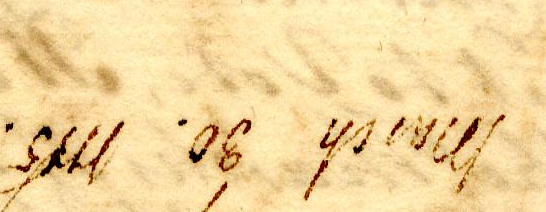March 30. 1775.
